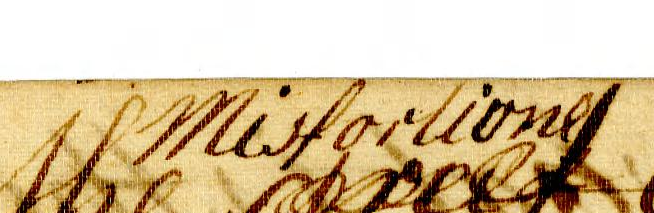Misfortune
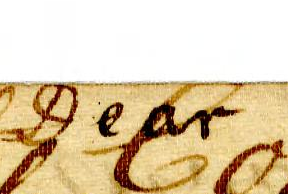Dear
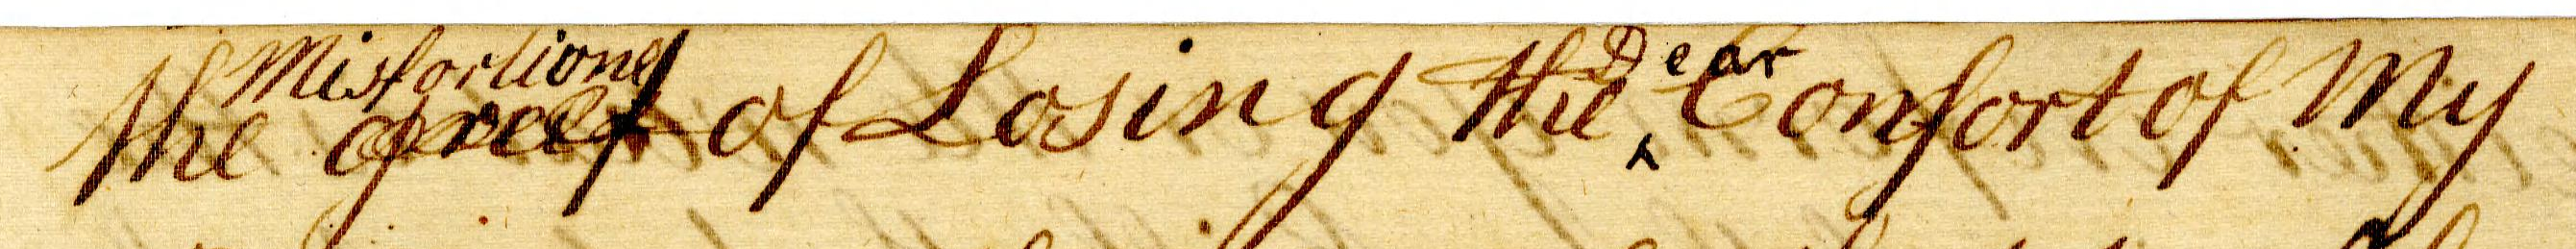the [greif] of Losing of the ^ Confort of My
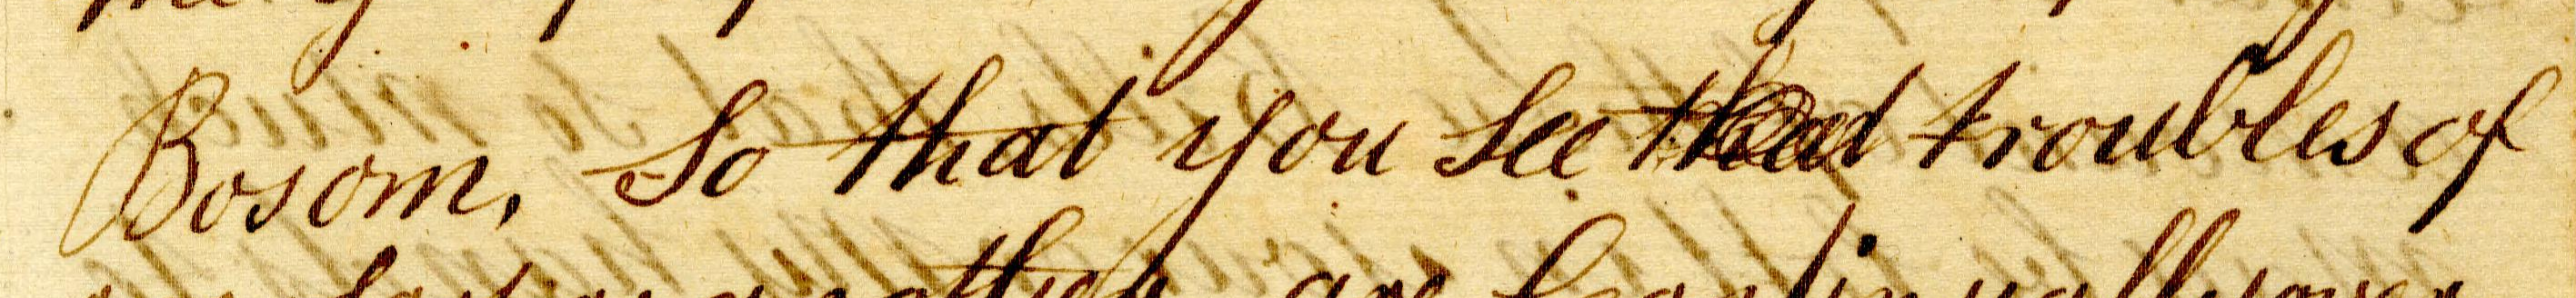Bosom, so that you see [that] troubles of
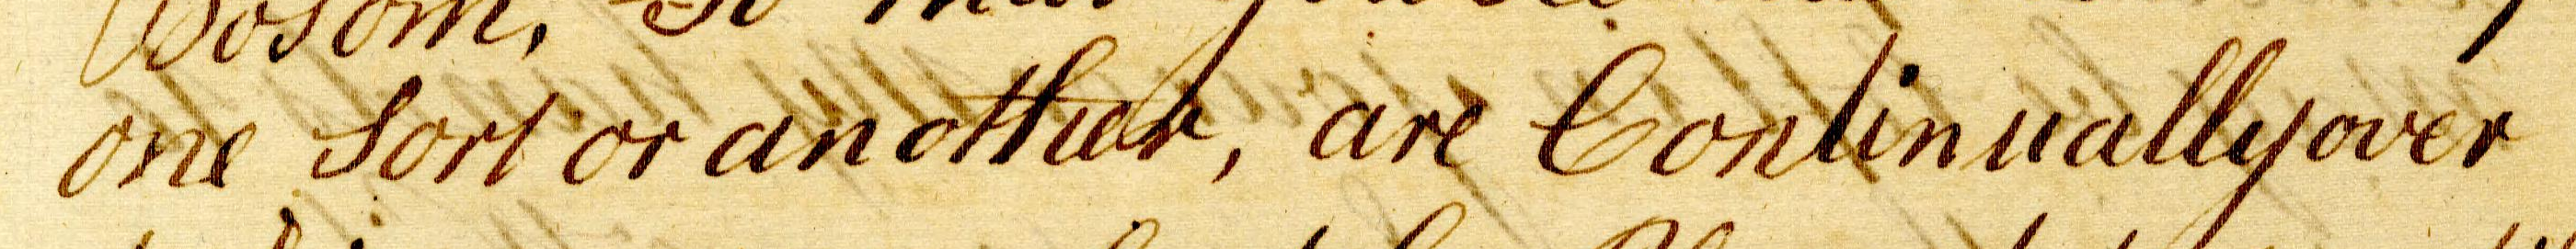one Sort or another, are Continually over
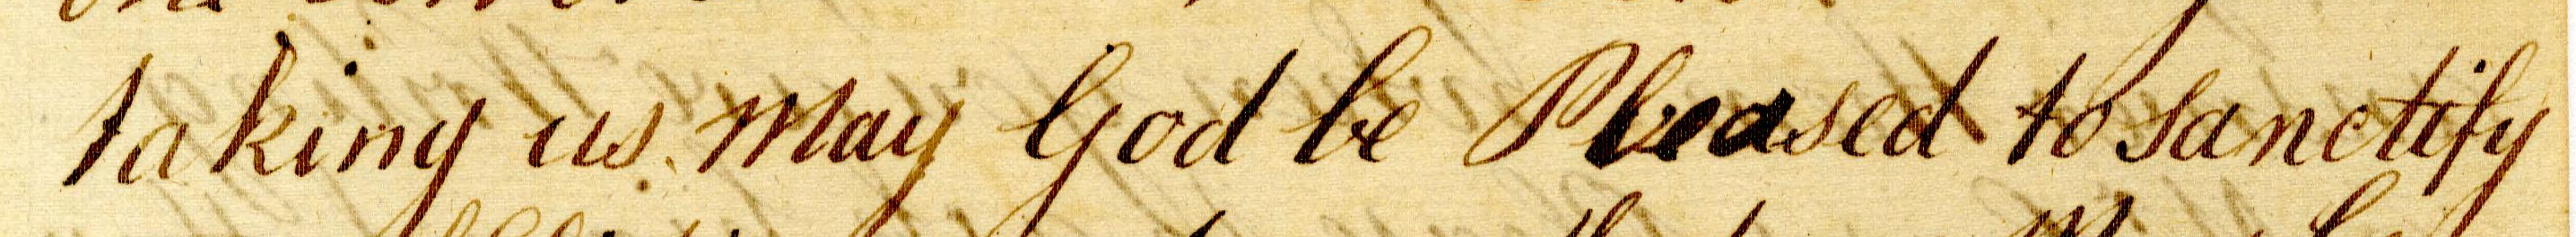taking us may God be Pleased to Sanctify
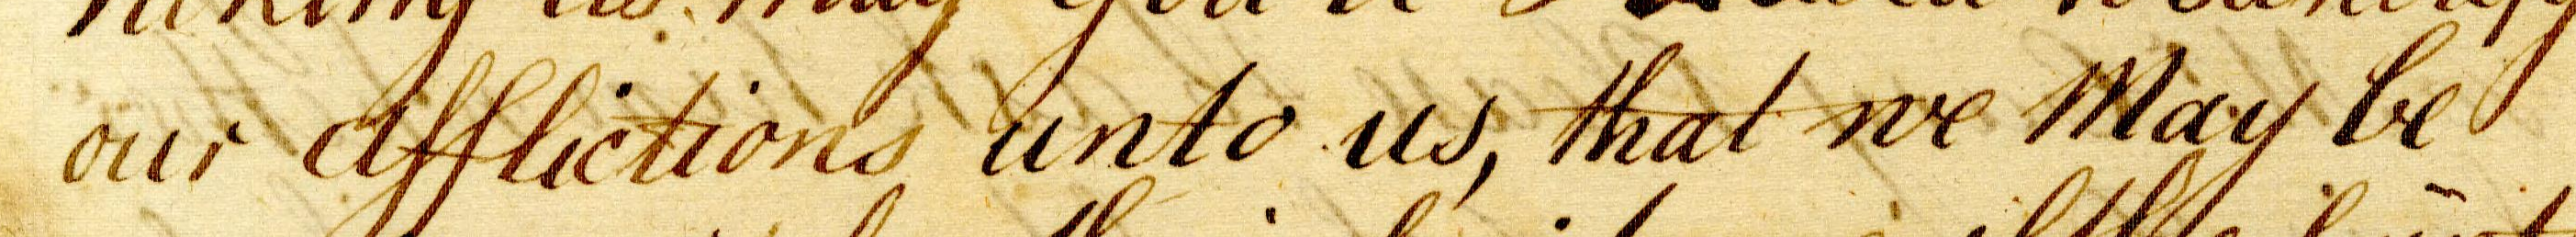our Afflictions unto us, that we May be
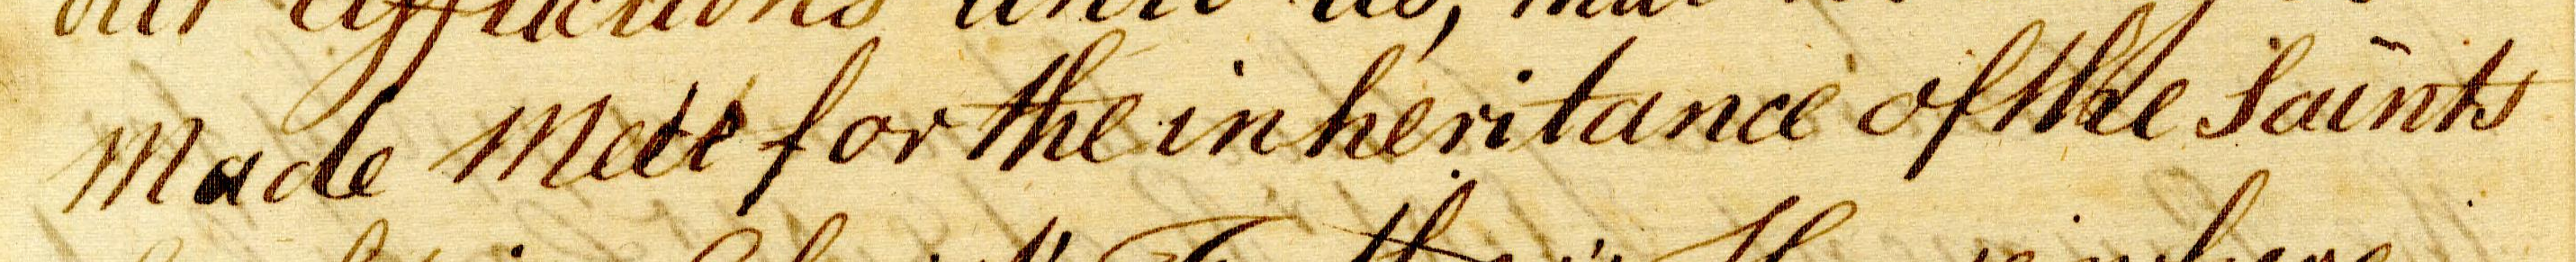Made Mett for the inheritance of the Saints
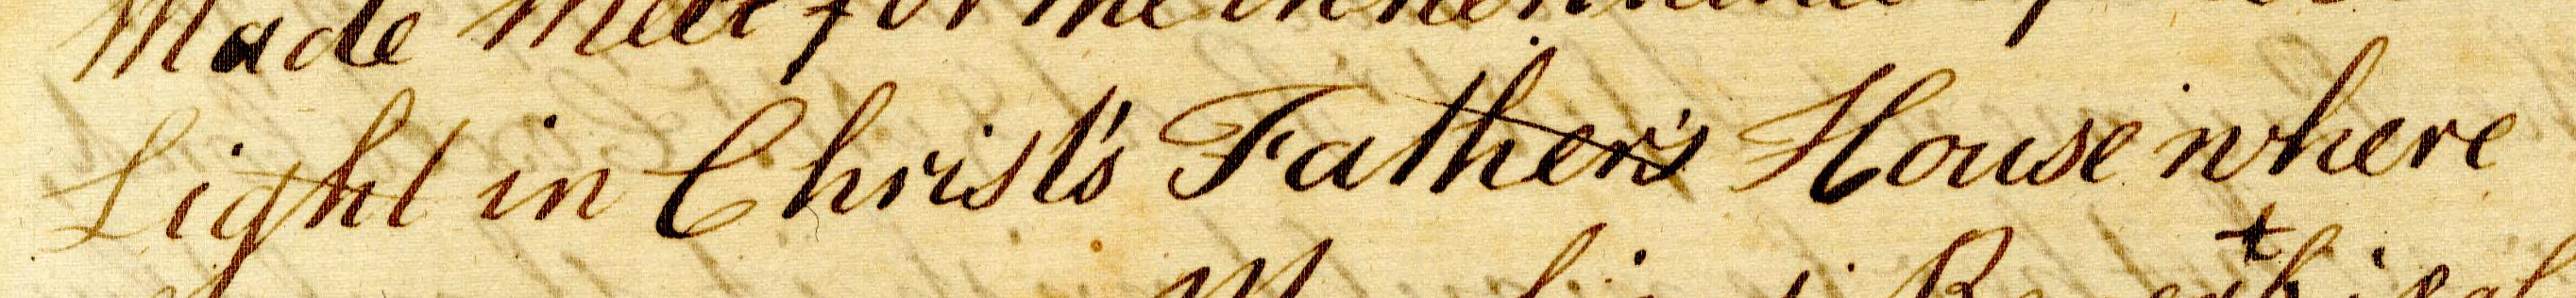Light in Christ's Fathers House where
